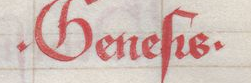.Geneſis.
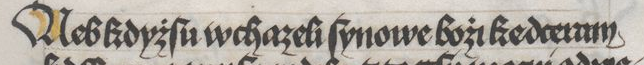Neb kdyżſu wchazeli ſynowe bożi kedceram
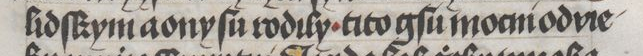lidſkym a ony ſu rodily.tito gſu mocni odvie¬
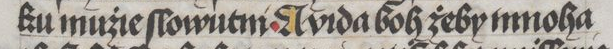ku mużie ſlowutné.A vida boh żeby mnoha
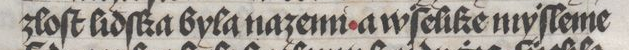zloſt lidſka byla nazemí.a wẛelike myẛlenie
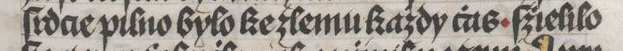ſrdcie pilno bylo ke zlemu każdy ċas.ſżielilo
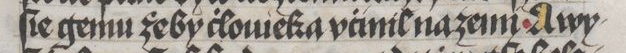ſie gemu żeby ċlouieka vċinil nazemi.A wy¬
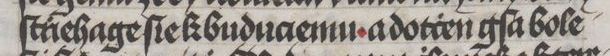ſtṙiehage ſie k buduciemu.a dotċen gſa bole¬
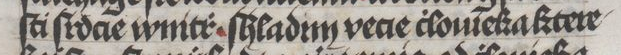ſti ſrdcie wnitṙ.ſhladim vecie ċlouieka ktere¬
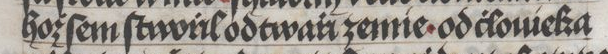hoż ſem ſtwoṙil odtwaṙi zemie.od ċlouieka
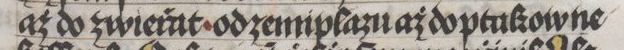až do zwieřat.odzemiplazu aż do ptakow ne¬
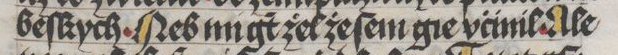beſkych.Neb mi ḡt żel żeſem gie vċinil.Ale
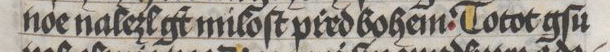noe nalezl ḡt miloſt pṙed bohem.Totot gſu
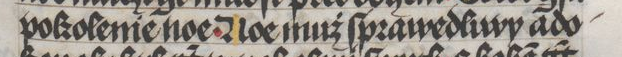pokoleníe noe.Noe muż ſprawedliwy a do¬
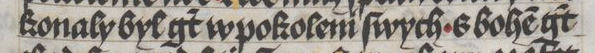konaly byl ḡt w pokolení ſwych.s bohē ḡt
